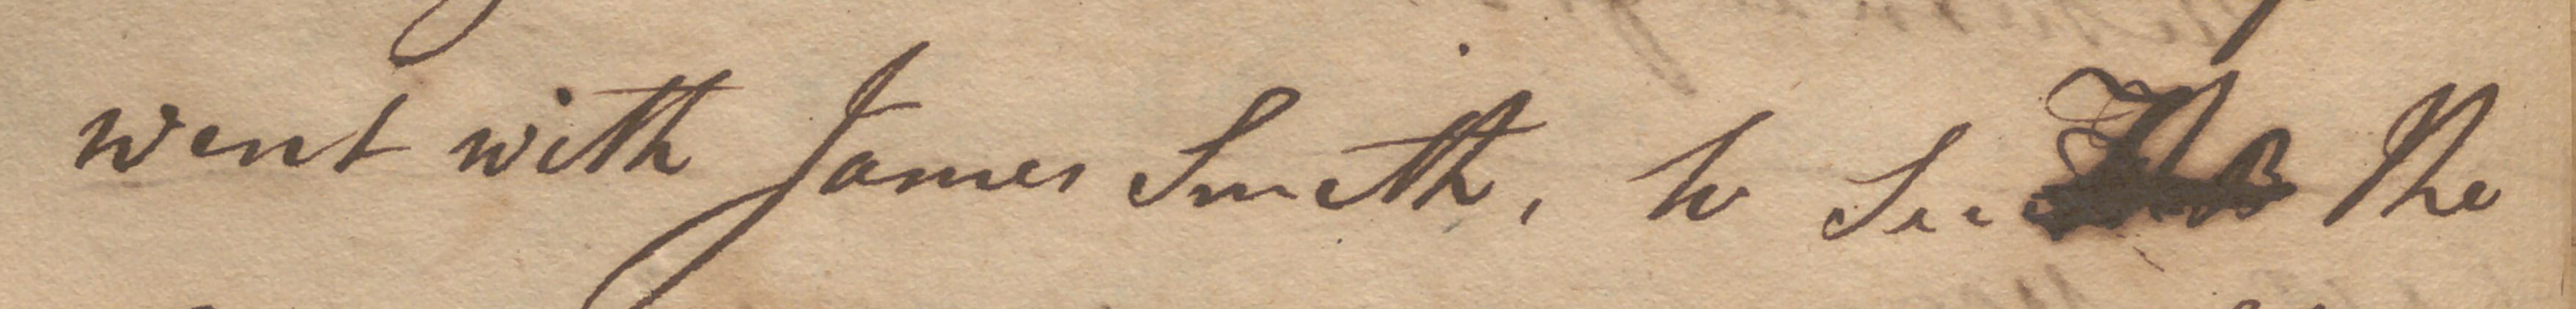went with James Smith, to see [___] the
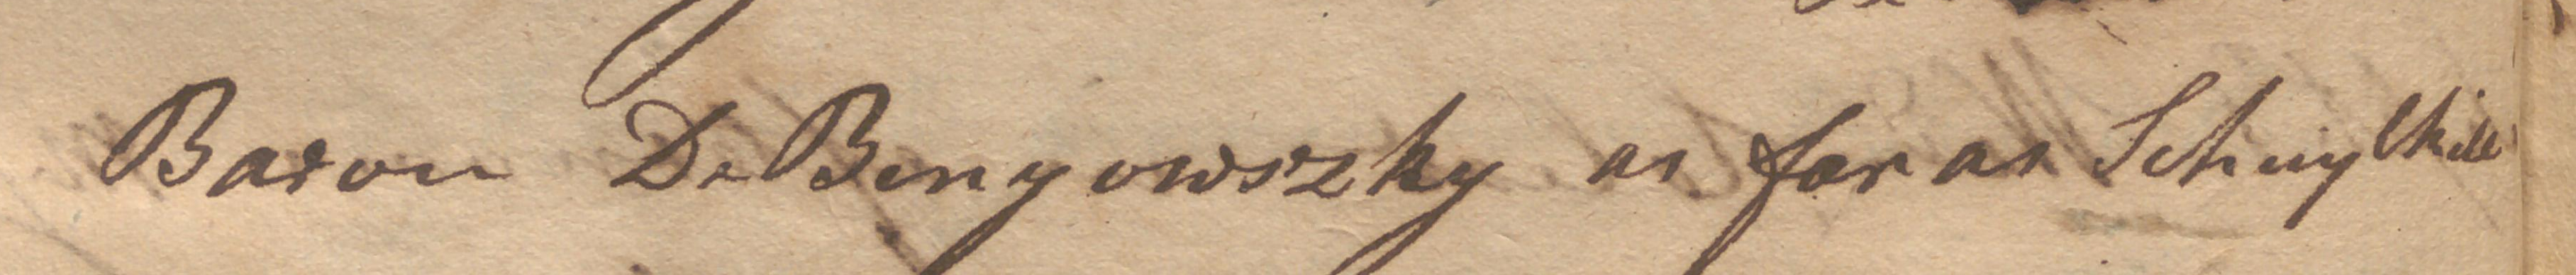Baron D. Benyowzky as for an Schuylkill
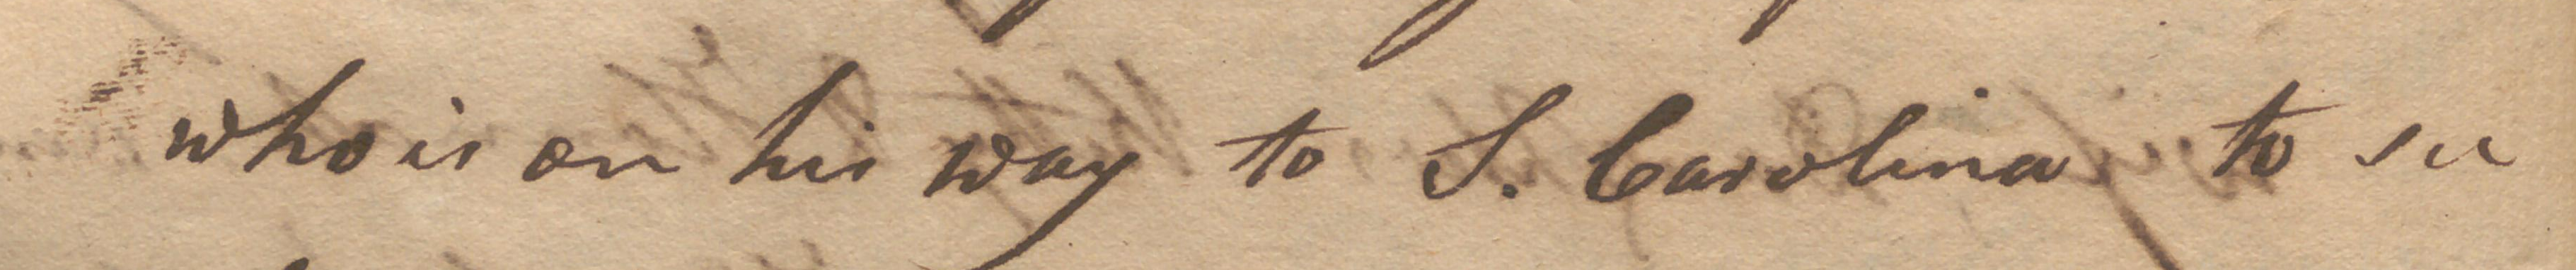who is an his way to S. Carolina to see
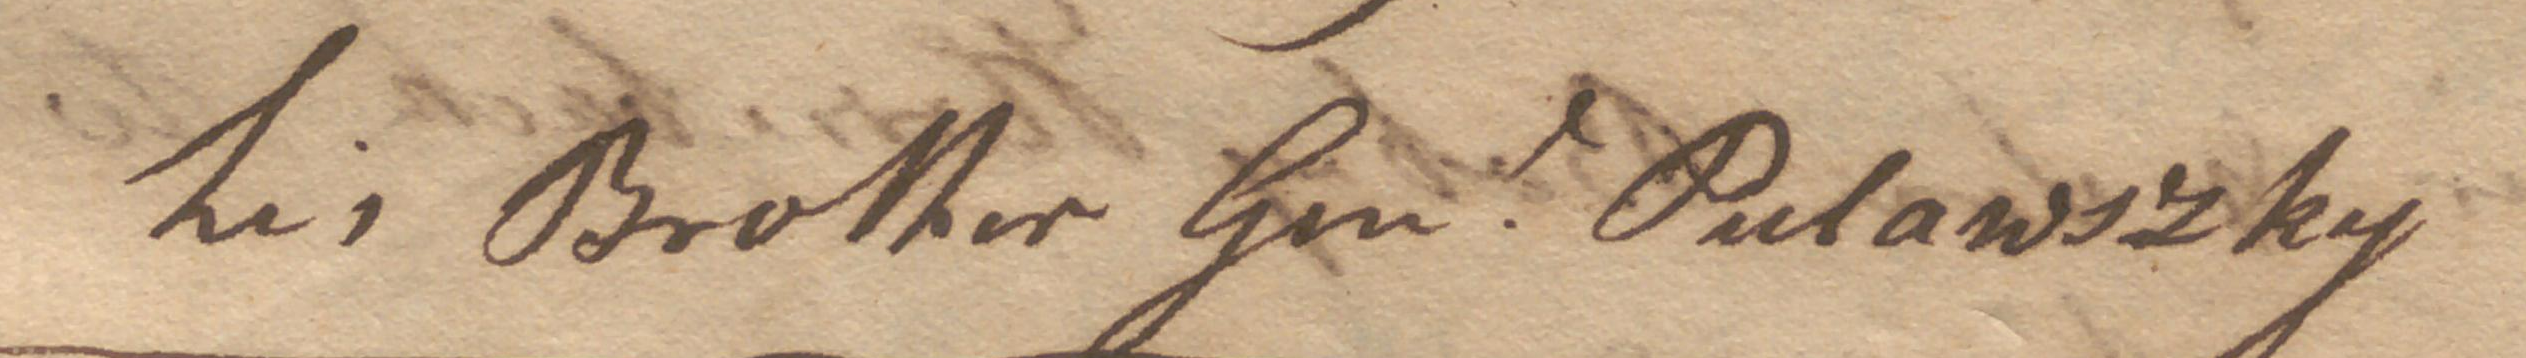his Brother Gen^l. Pulanszky
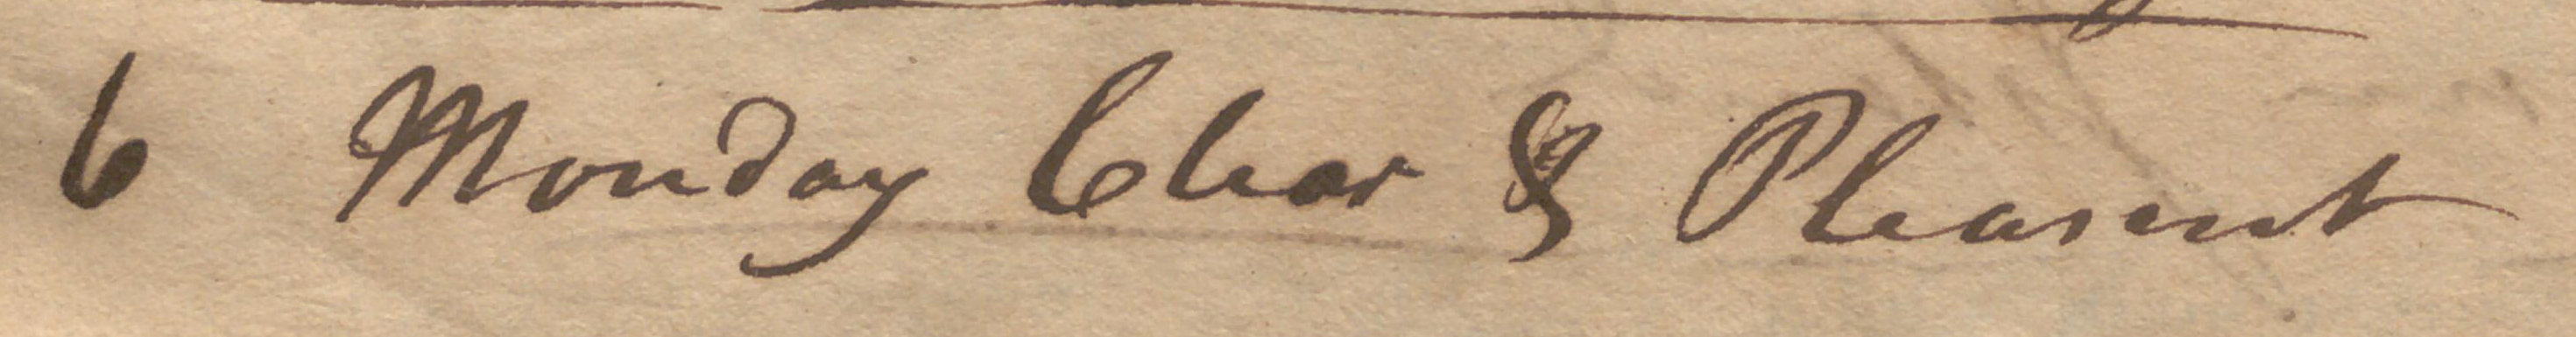6 Monday Clear & Pleasent
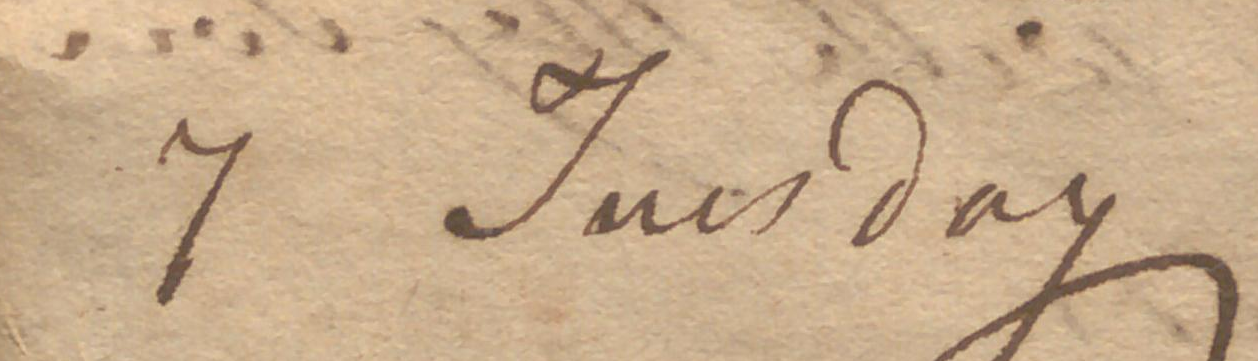7h Tuesday
